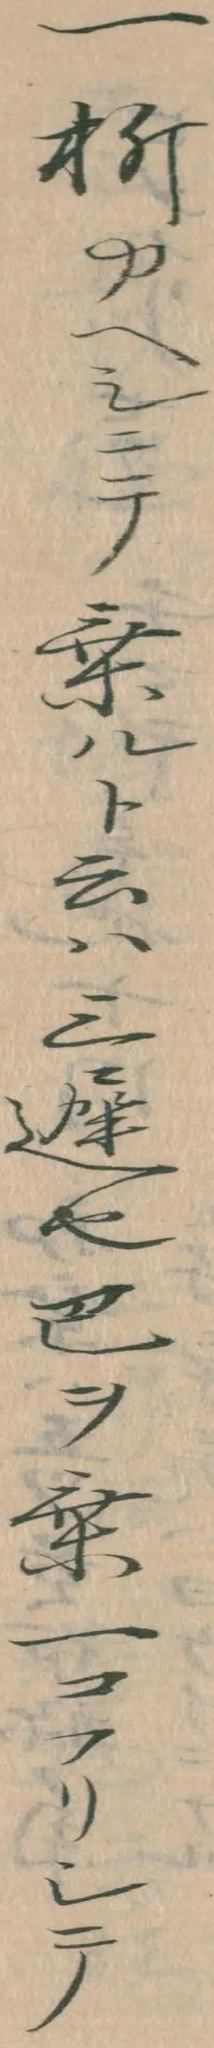一折カヘシニテ乗ルト云ハ三遅也巴ヲ乗一コフリシテ
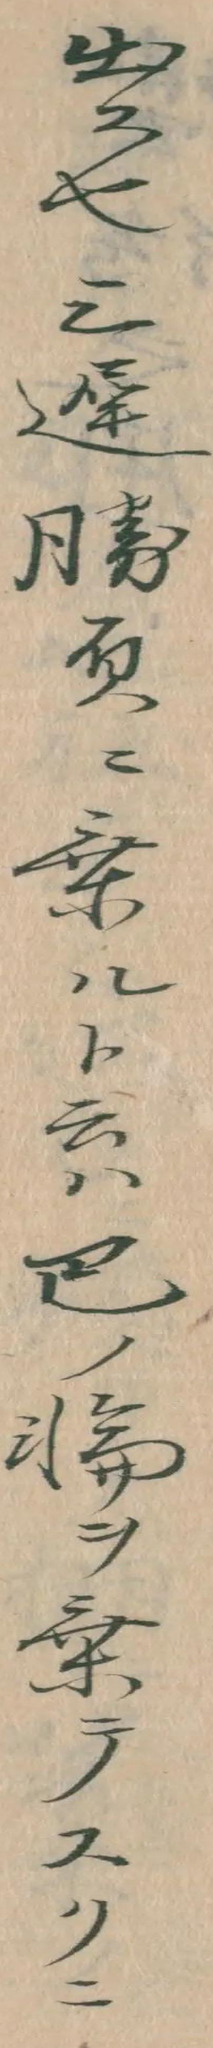出ス也三遅勝負ニ乗ルト云ハ巴ノ輪ヲ乗テスクニ
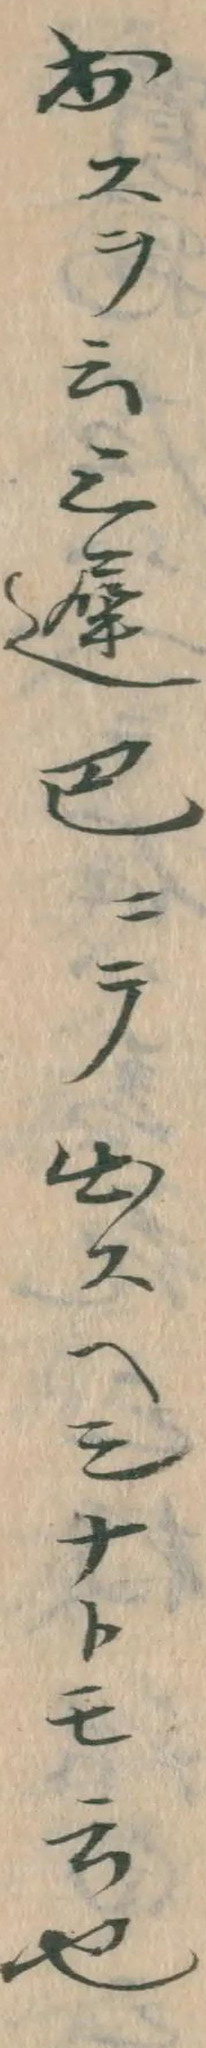出スヲ云三遅巴ニテ出スへシナトモ云也
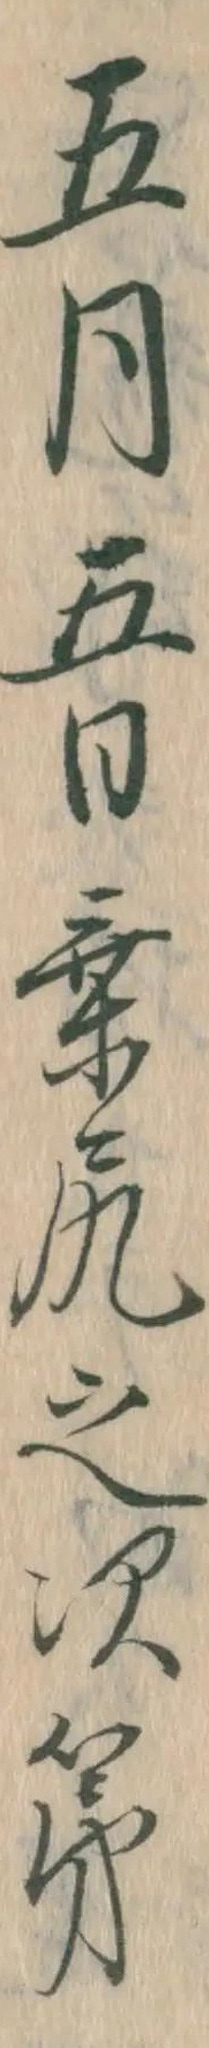五月五日乗尻之次第
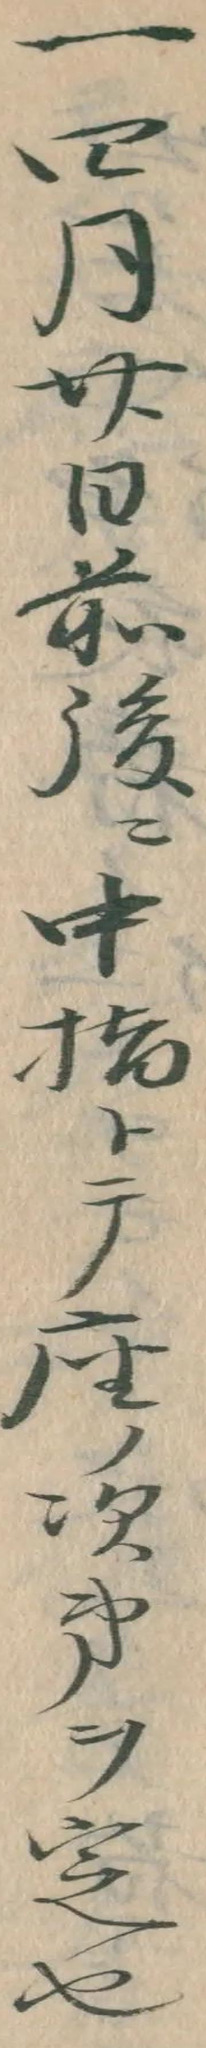一四月廿日前後ニ中指トテ座ノ次第ヲ定也
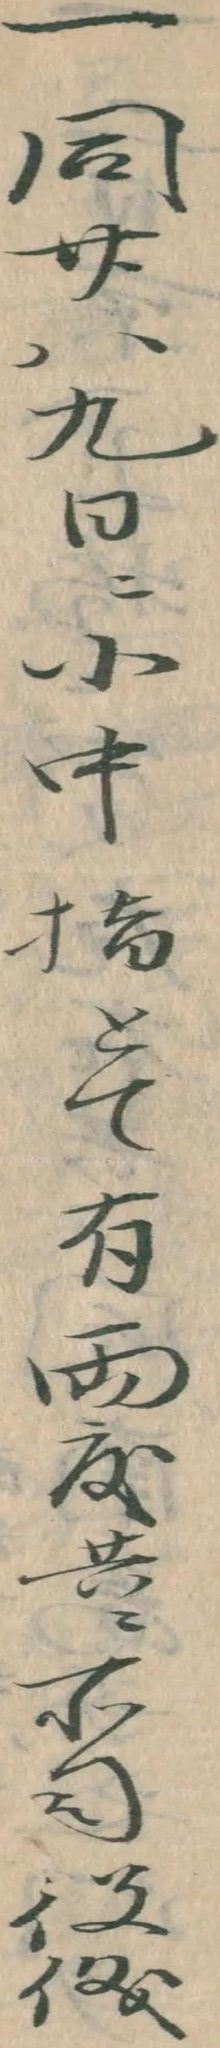一同廿八九日ニ小中指とて有両度共ニ所司役儀
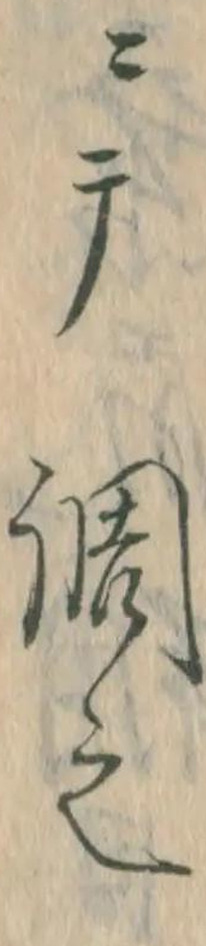ニテ調之

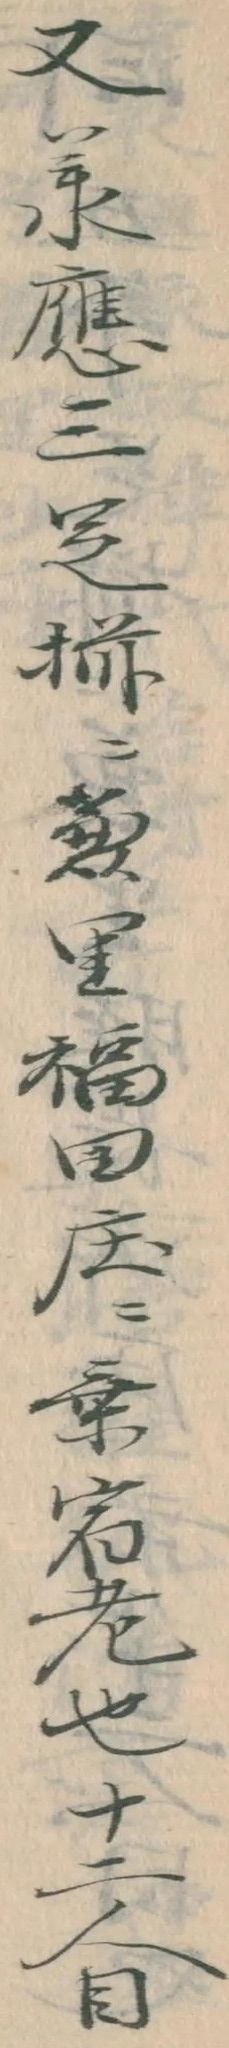又承応三足揃ニ兼里福田庄ニ乗宿老也十二人目
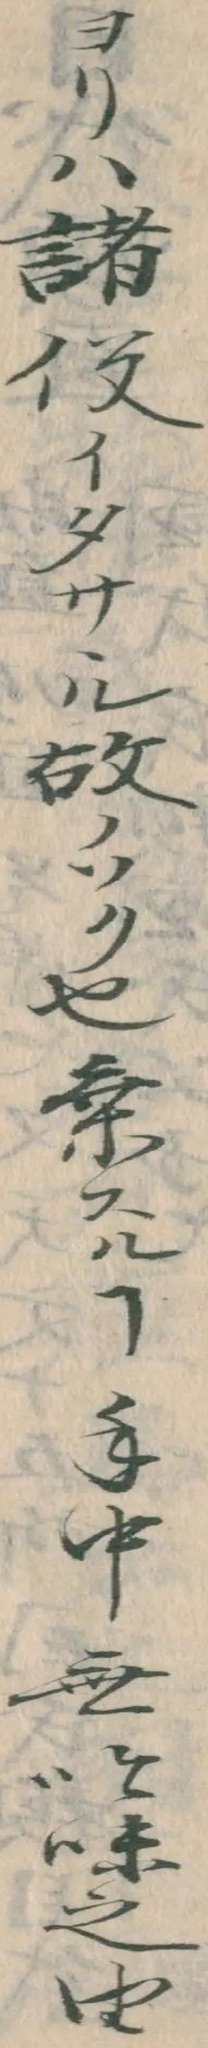ヨリハ諸役イタサヽル故ノソク也乗スルコト手中無吟味之由
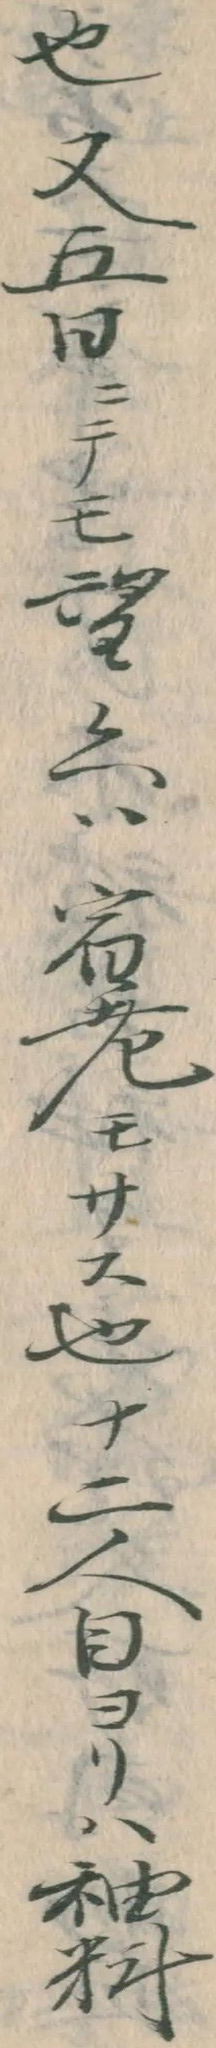也又五日ニテモ望候ヘハ宿老モサス也十二人目ヨリハ袖料
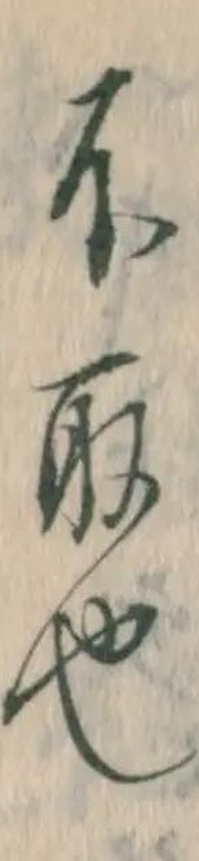不取也
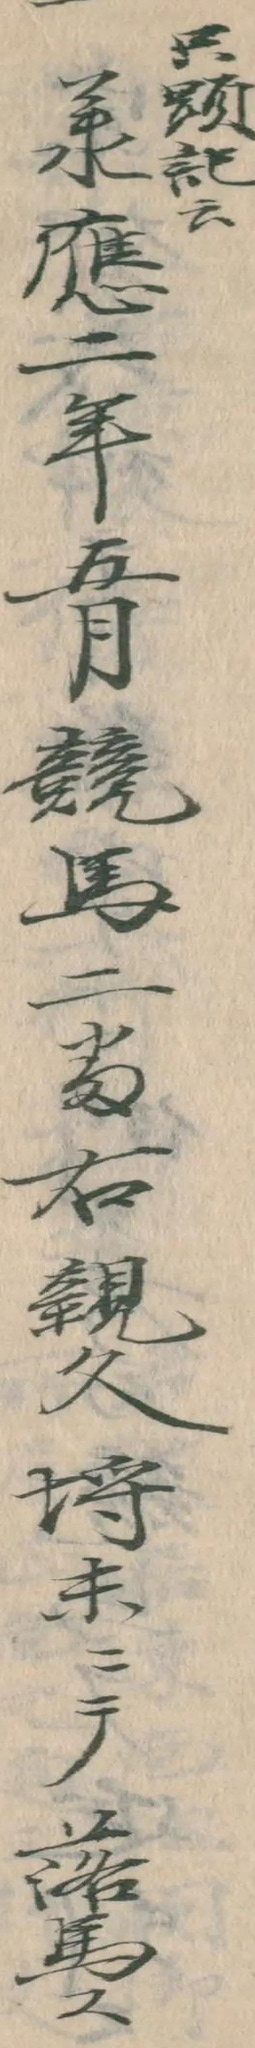一承応二年五月競馬二番右親久埒末ニテ落馬ス
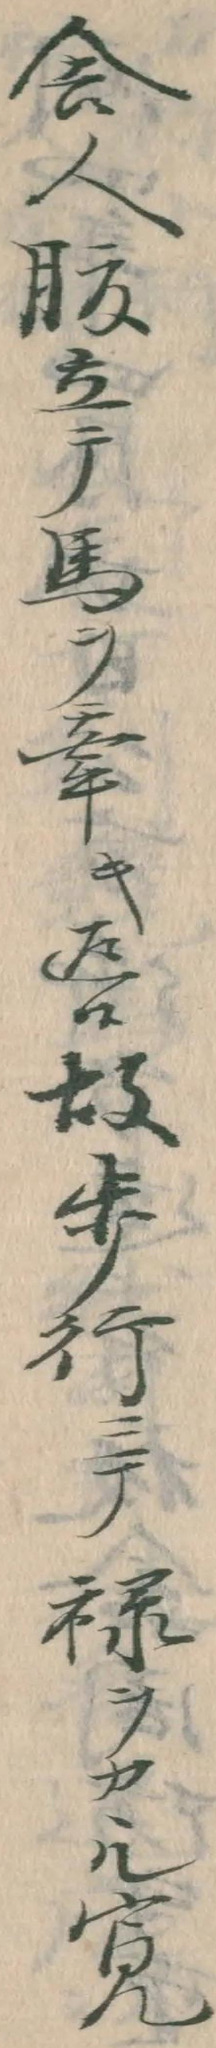舎人腹立テ馬ヲ牽キ返候故歩行ニテ禄ヲカヽル寛
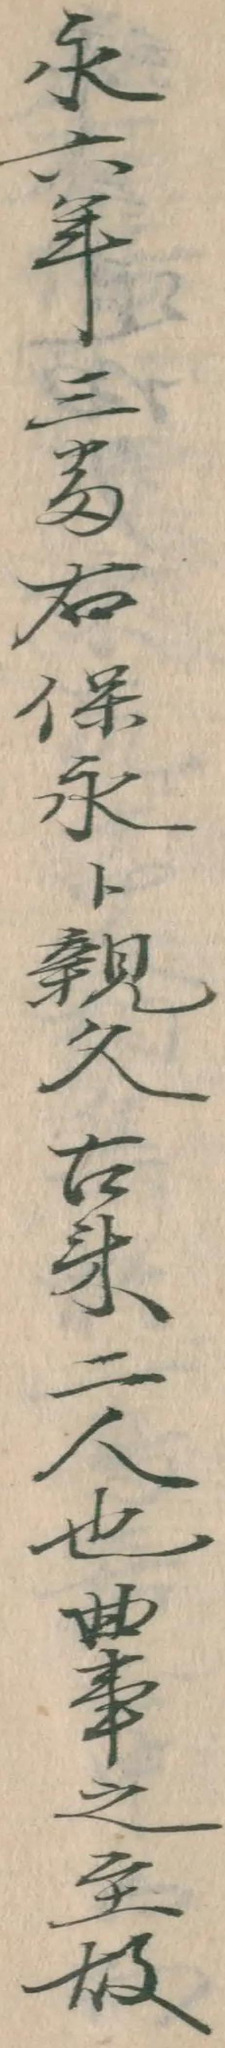永六年三番右保永ト親久古来二人也曲事之至故
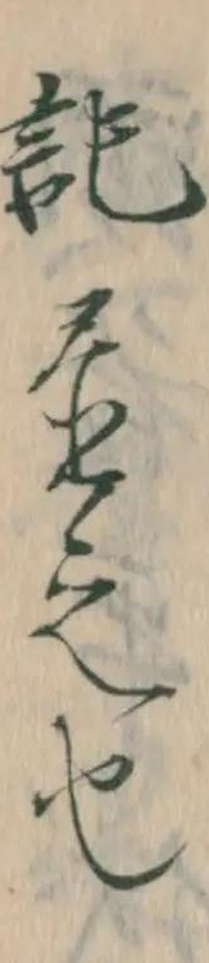記置之也
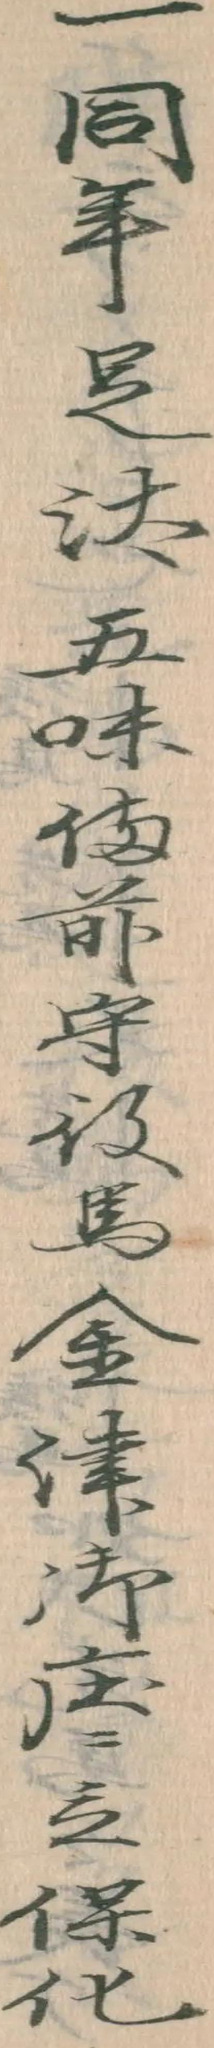一同年足汰五味備前守役馬金津御庄ニ立保化
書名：賀茂社記録. 第11冊
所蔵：国立国会図書館 National Diet Library, JAPAN
